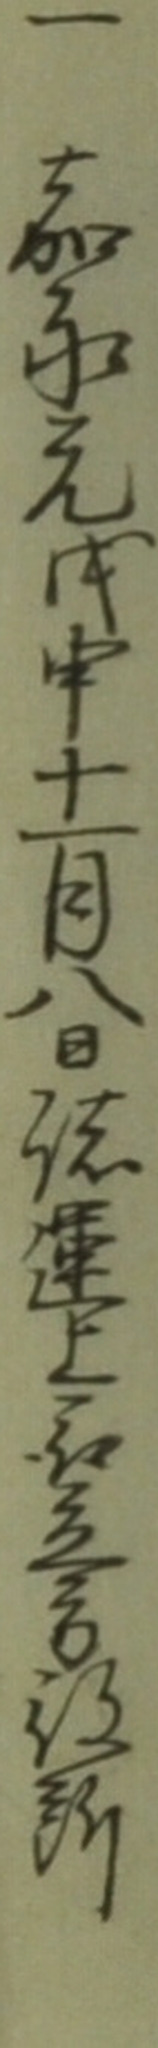一嘉永元戊申十一月八日諸運上取立方役所
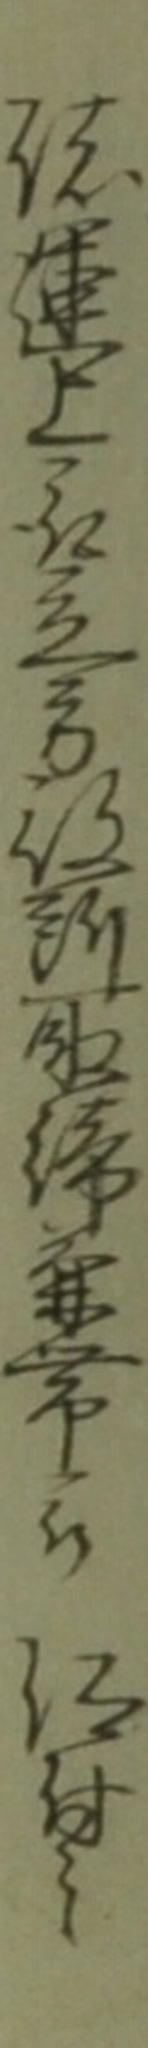諸運上取立方役所取締兼帯被仰付之

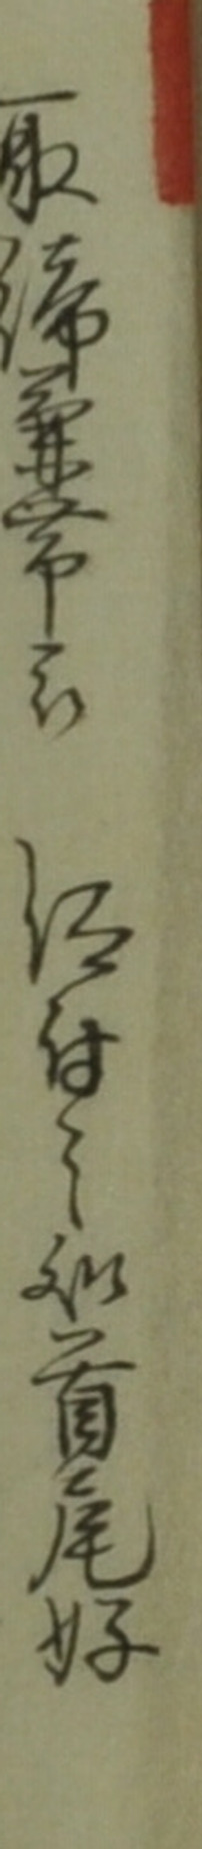取締兼帯被仰付之処首尾好
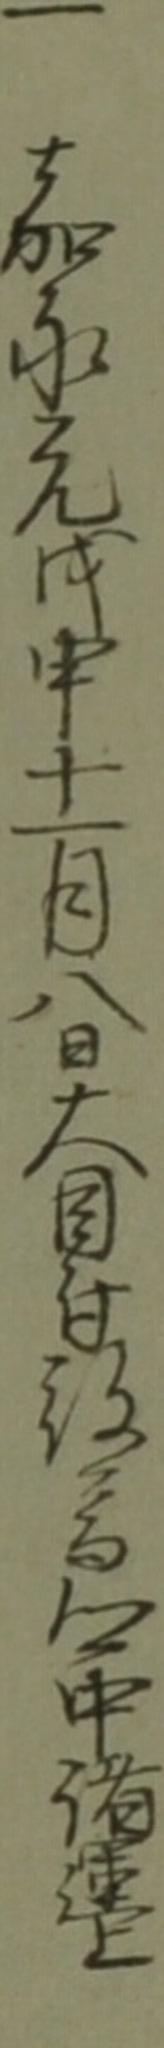一嘉永元戊申十一月八日大目付役ニ而郷中諸運上
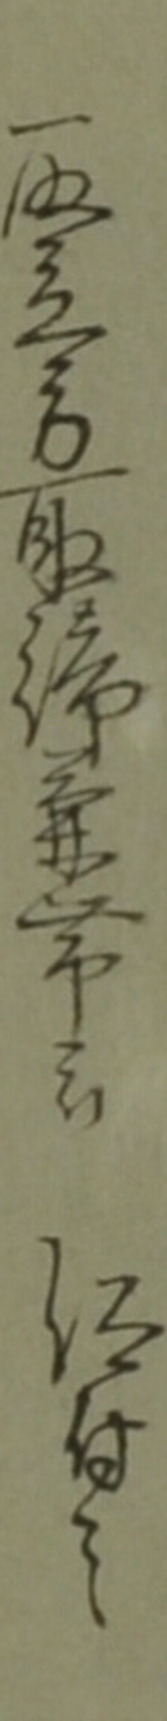取立方取締兼帯被仰付之
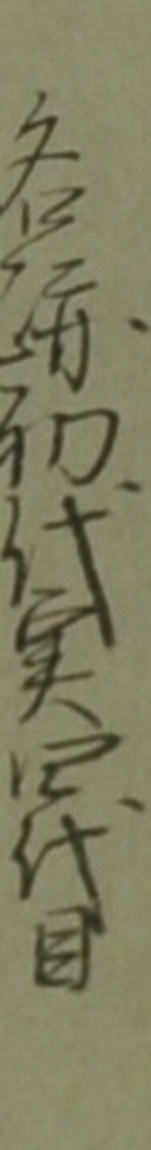名跡初代実四代目
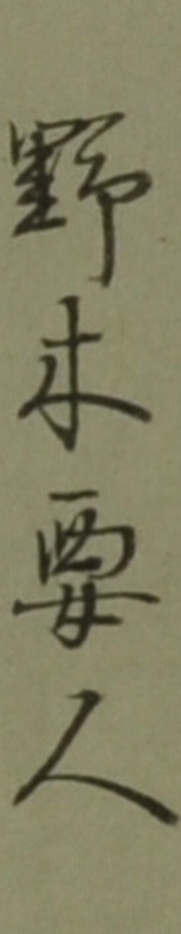野木要人
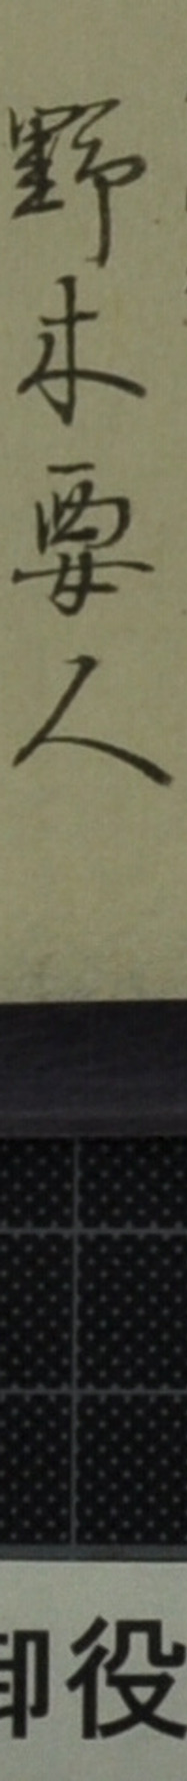野木要人
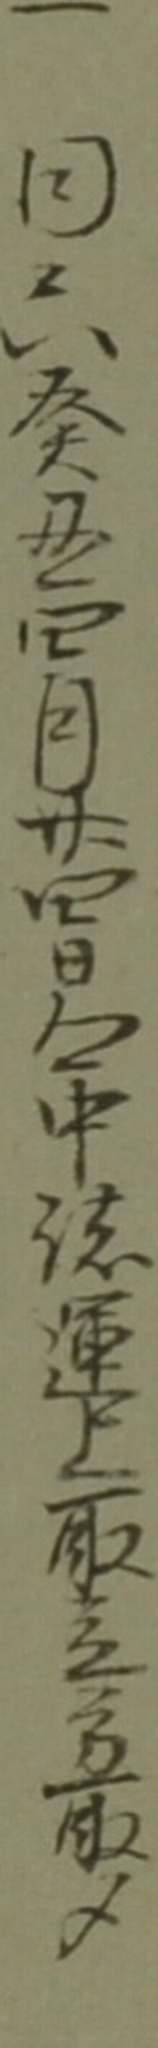一同六癸丑四月廿四日郷中諸運上取立方取〆
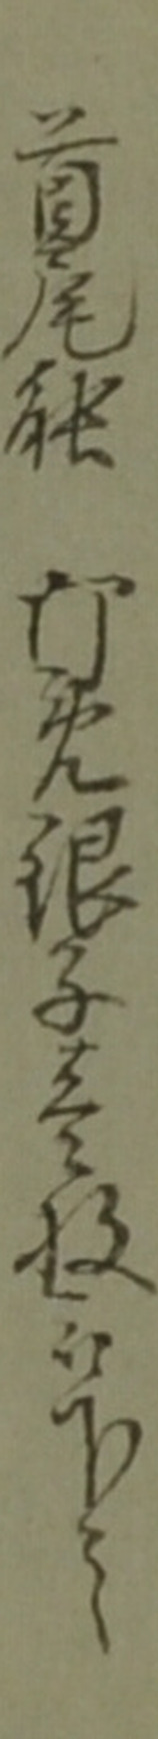首尾能御免銀子壱枚被下之
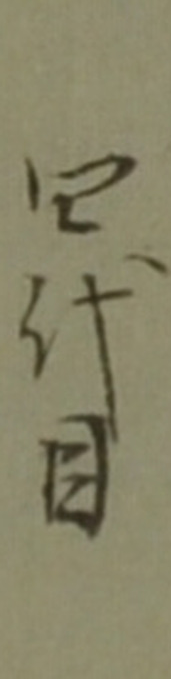四代目
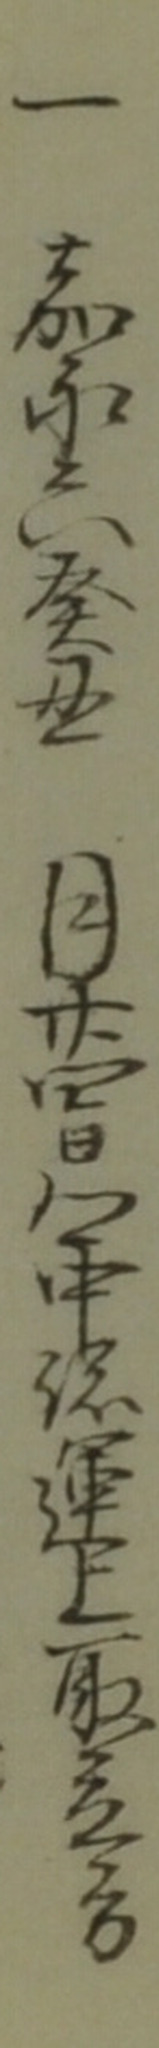一嘉永六癸丑月廿四日郷中諸運上取立方
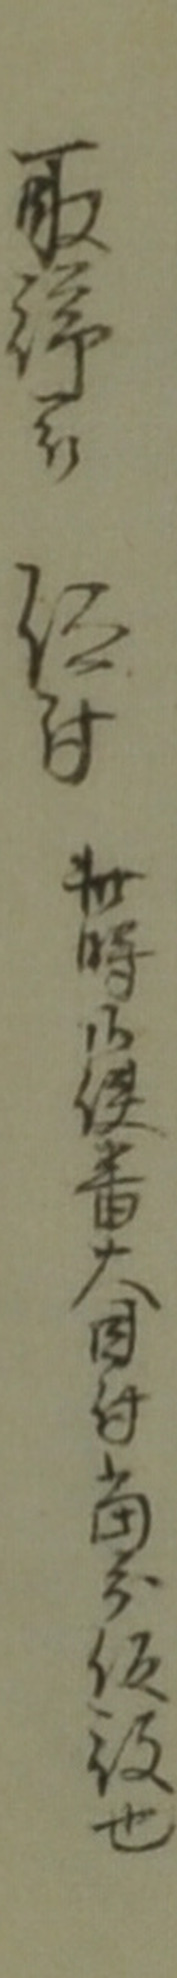取締被仰付此時御使番大目付当分仮役也

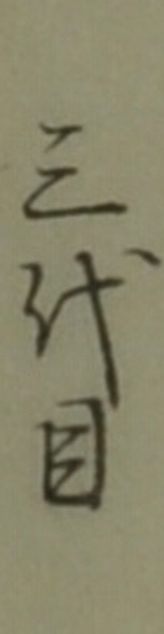三代目
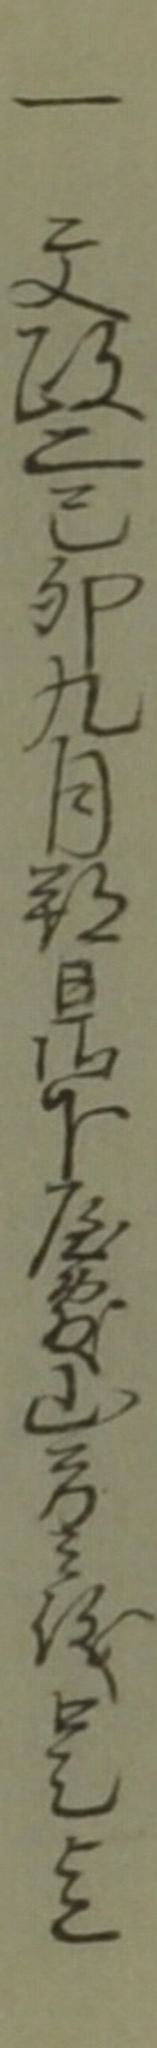一文政二己卯九月朔日御下屋敷山方之儀是迄
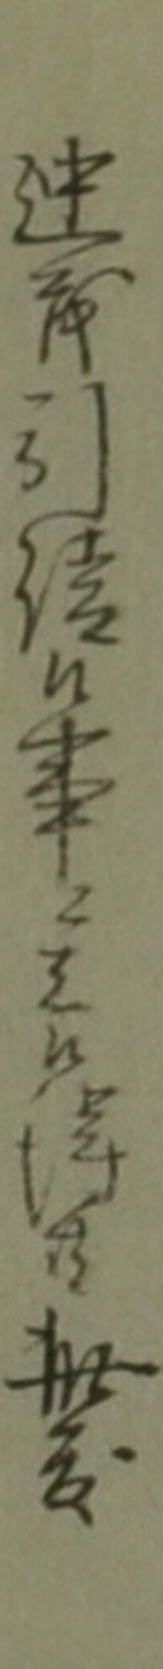迚茂引請候事ニ者候得共此度
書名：諸御役代々録（三）
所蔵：伊那市立高遠町図書館・合同会社AMANE
